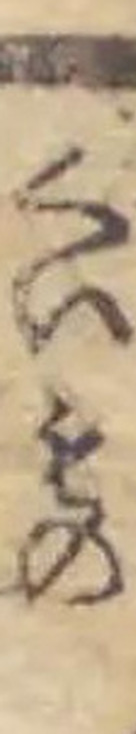くいもの
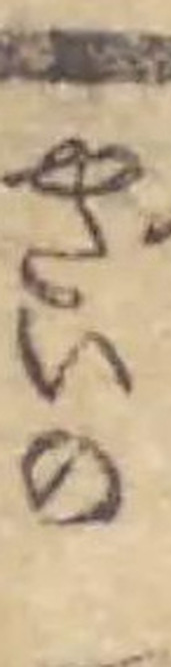やたいの
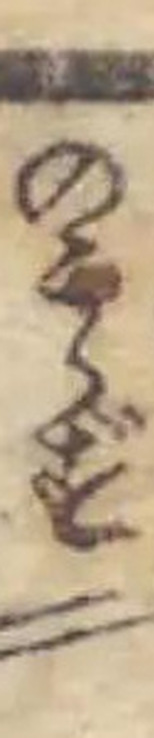のこらず

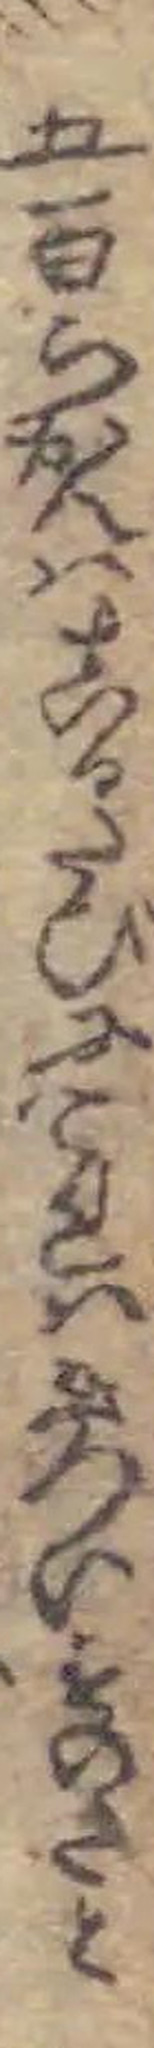五百らかんハまいるたびにこれハきついものたとゞゞ
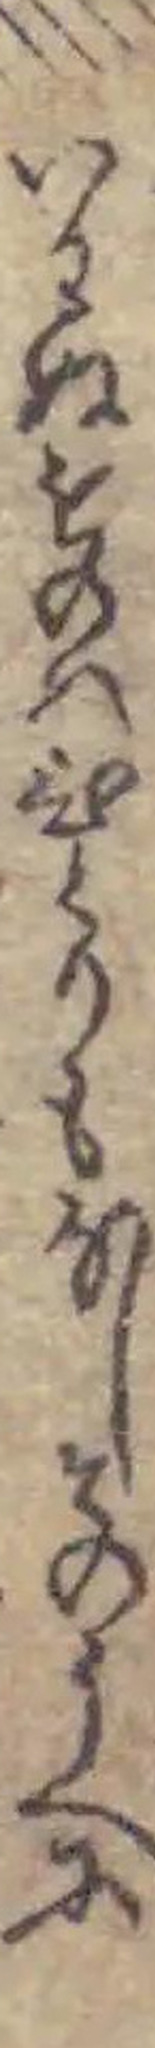いわふものハひとりもなしそのうへに
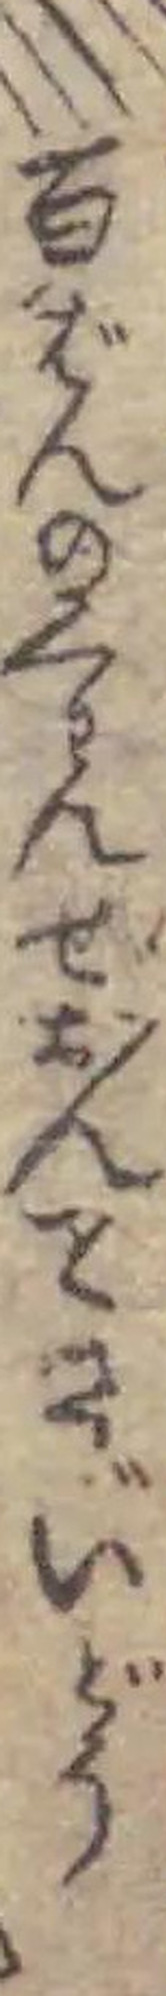百ばんのくわんぜおんをさゞいどう
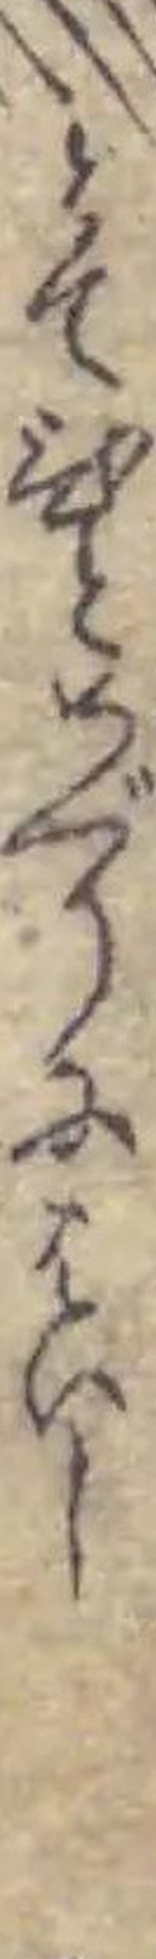とてひとめぐりにはいし
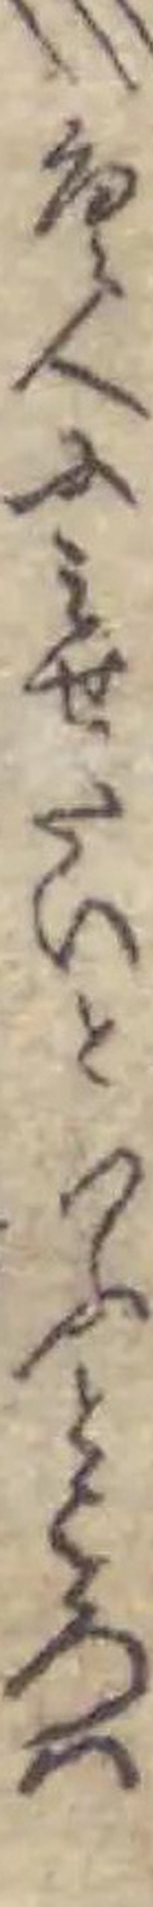唐人にミせたいといふところハ
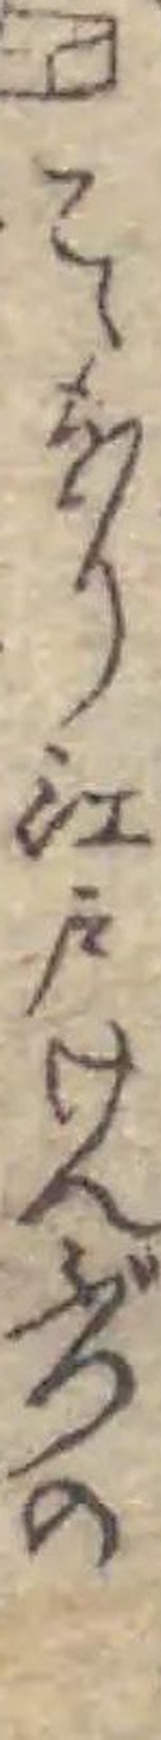こゝなり江戸けんぶつの
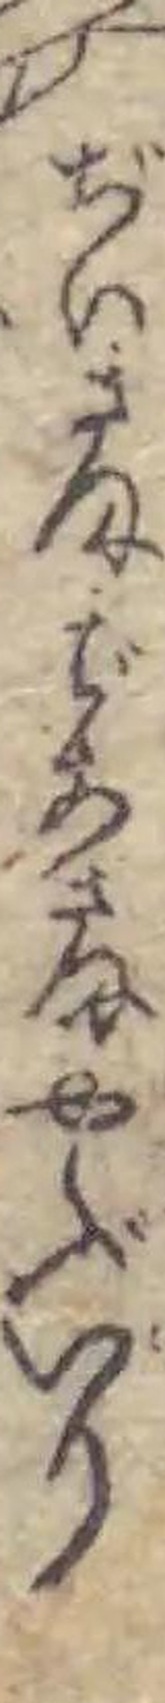ぢいさまばあさまやぶいり
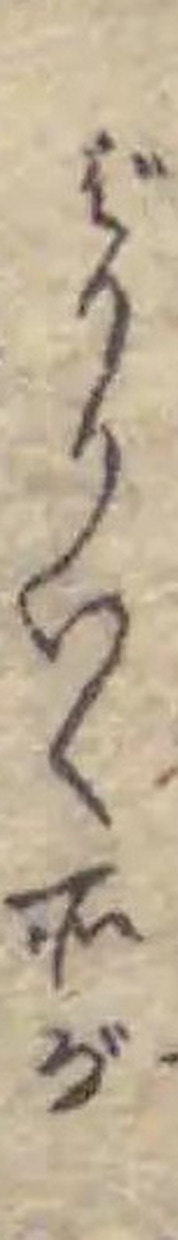ばかりいく所が
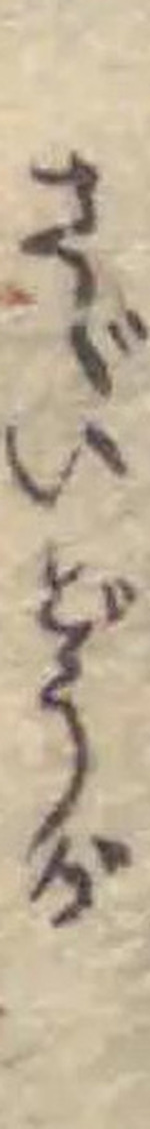さゞいどうが
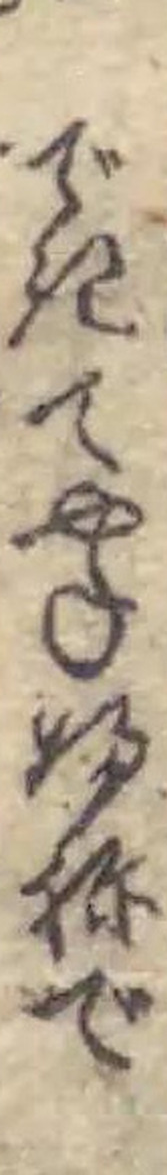できてやねふねで
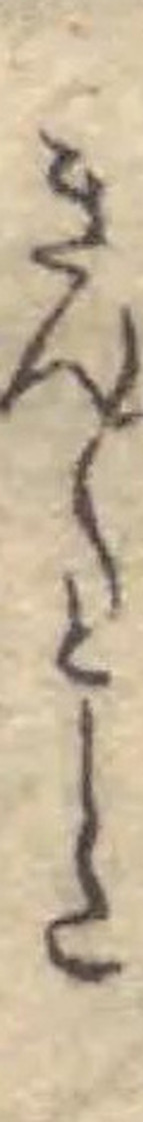きん〳〵として
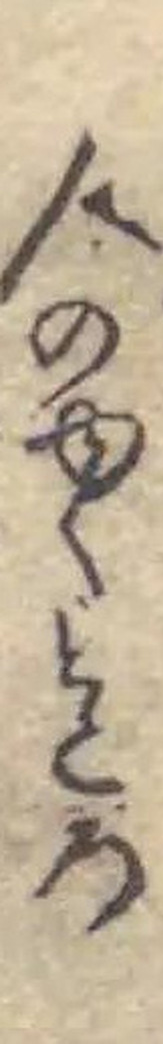人のゆくところ
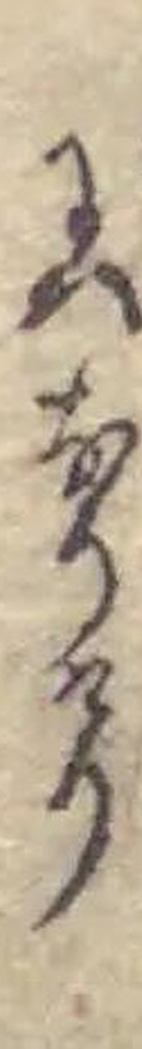にハなりけり
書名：豆男江戸見物 2巻
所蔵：国立国会図書館 National Diet Library, JAPAN
